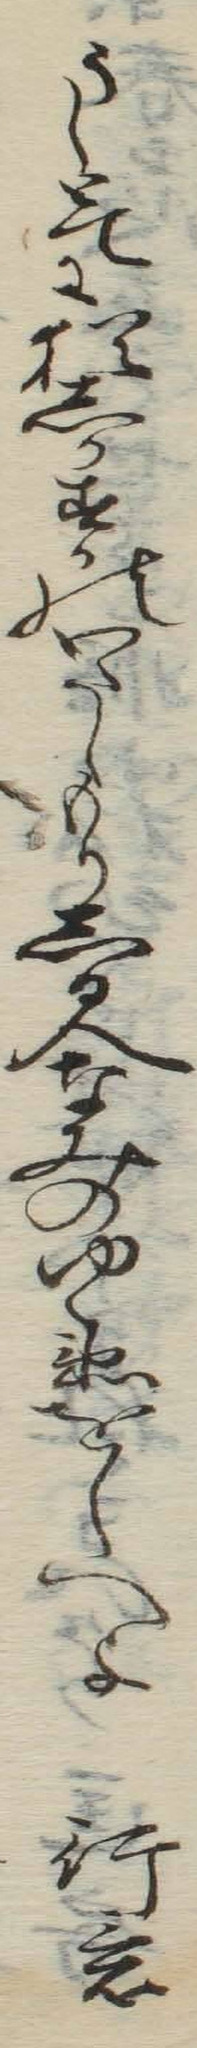うしとてに猶しかすかのわたしもりしる人なみのゆくゑをしへよ行長
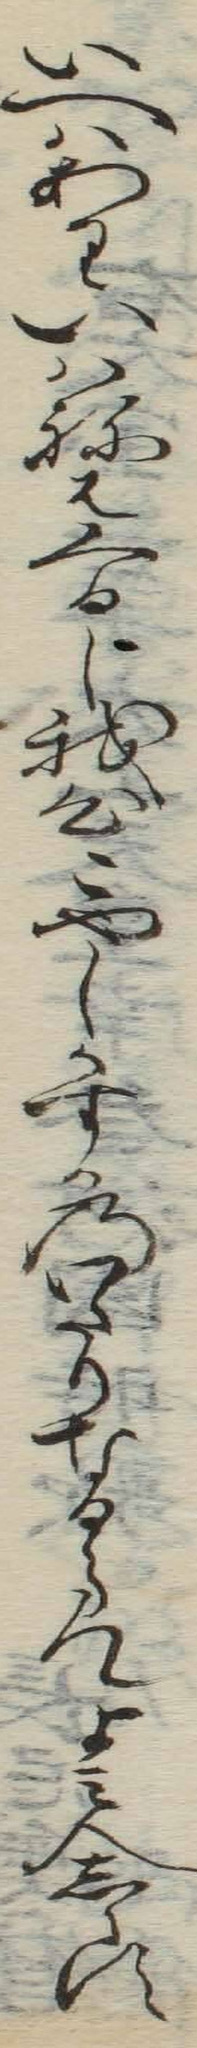いへはありいはねはくるし我心こやしかすかのわたりなるらんよみ人しらす
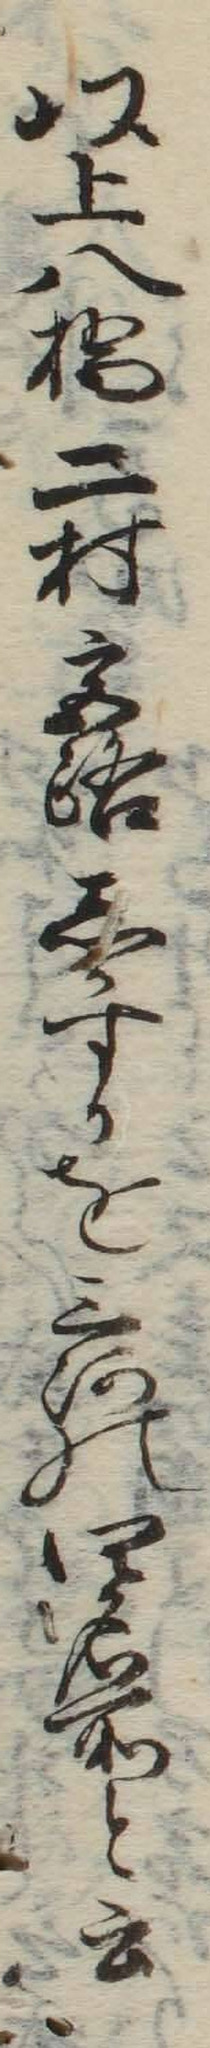以上八橋二村宮路しかすかを三河の四名所と云

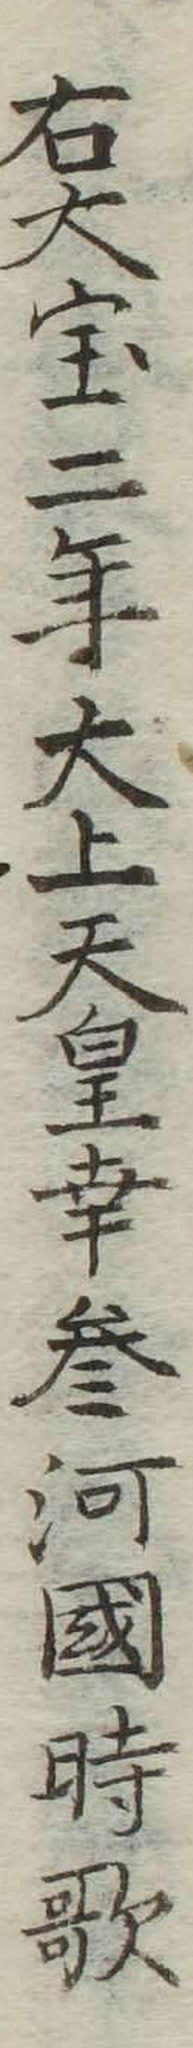右大宝二年大上天皇幸参河国時歌
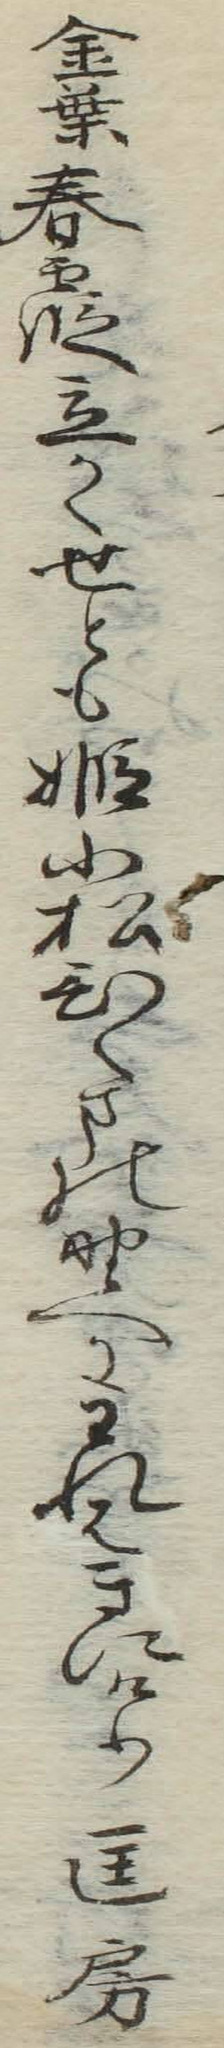金葉春霞立かくせとも姫小松ひくまの野へにわれはきにけり匡房
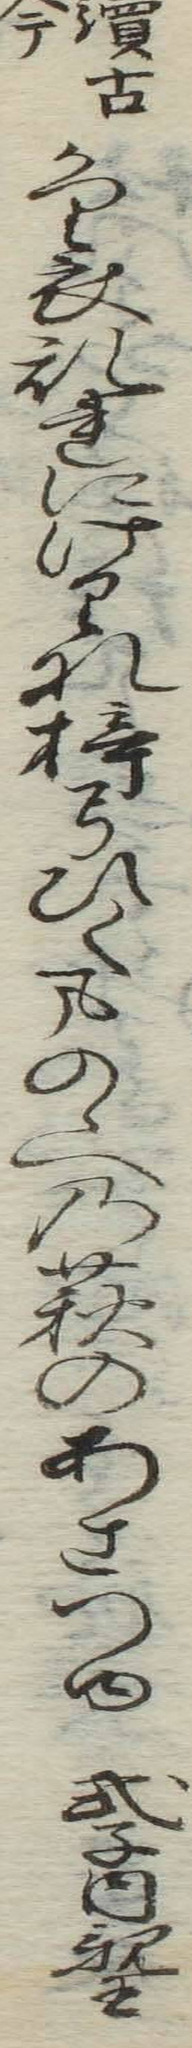続古今かり衣乱れにけりな梓弓ひくまのゝへの萩のあさつゆ式子内親王
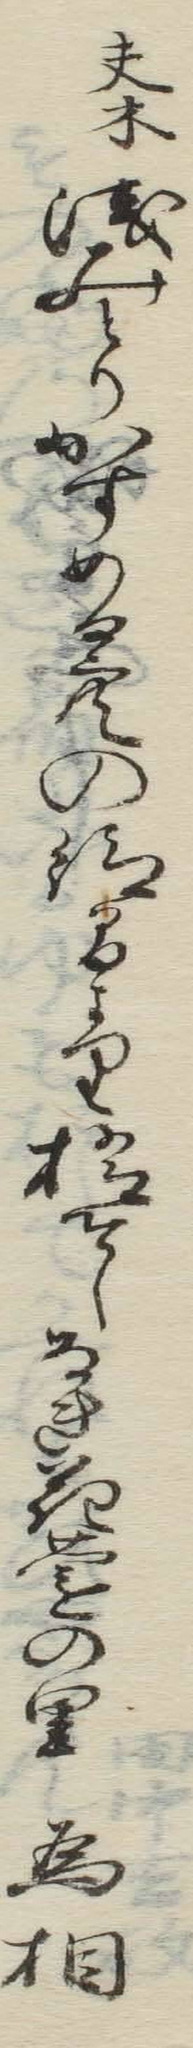夫木浅みとりかすめる空の絶間より梢そしろき花園の里為相
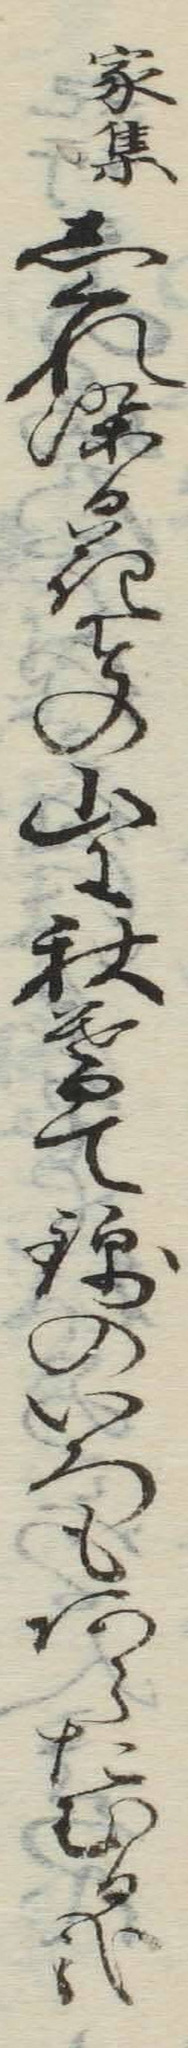家集しくれ染る花その山に秋暮て錦のいろもあらたむる哉
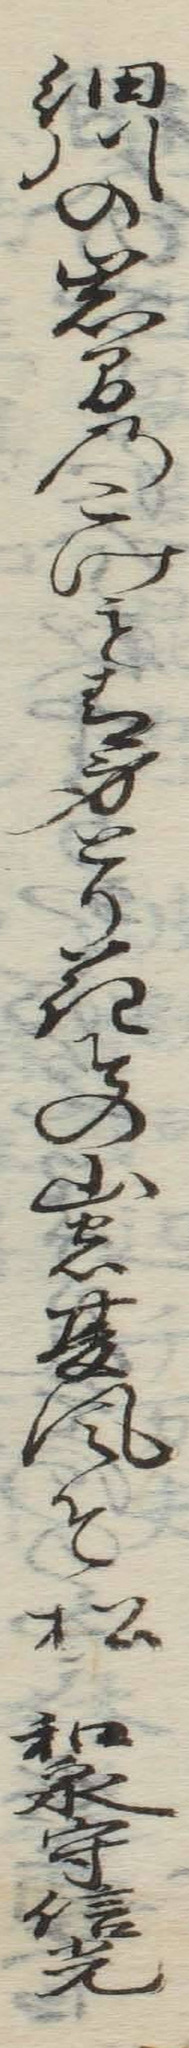細川の岩間のこけも青みとり花その山の夏風そ松和泉守信光
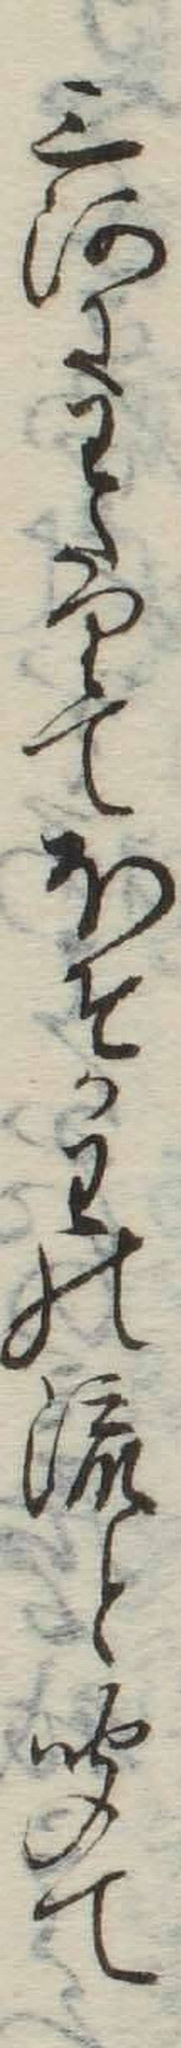三河にわたりてほそかわの流と聞て
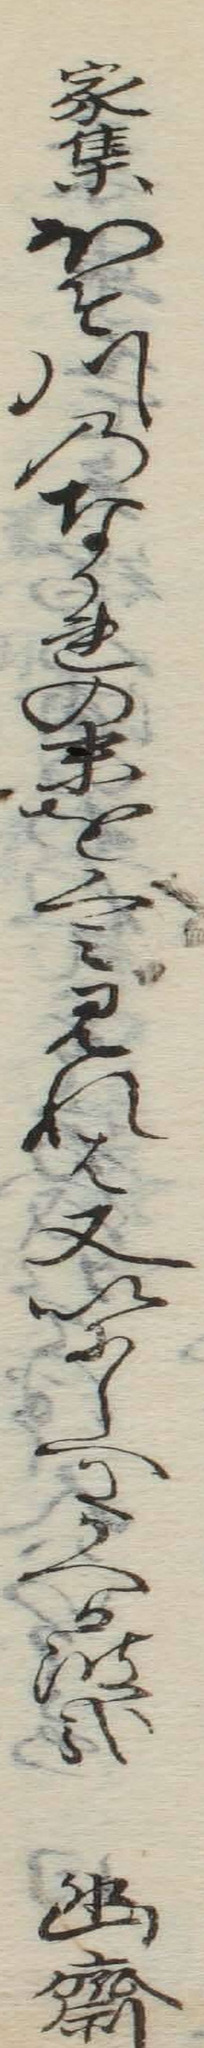家集ほそ川のなかれの末をくみ見れはまたいにしへにかへる波哉幽斎
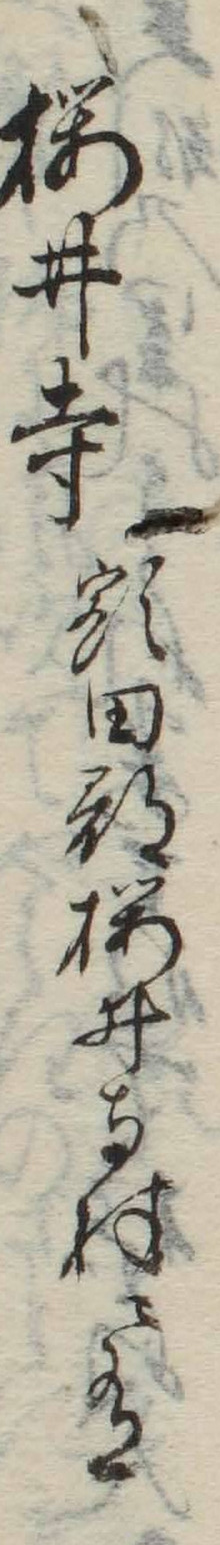桜井寺額田郡桜井寺村に有
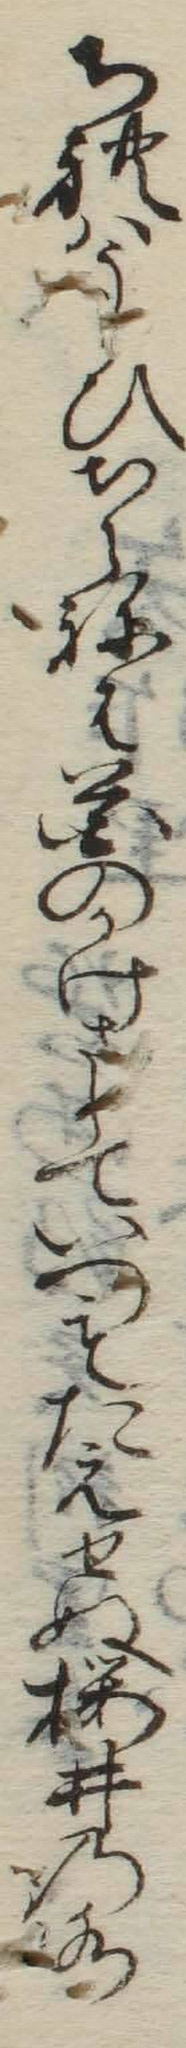ちれはうかひちらねは花のかけさしていつもたえせぬ桜井の水弘法大師

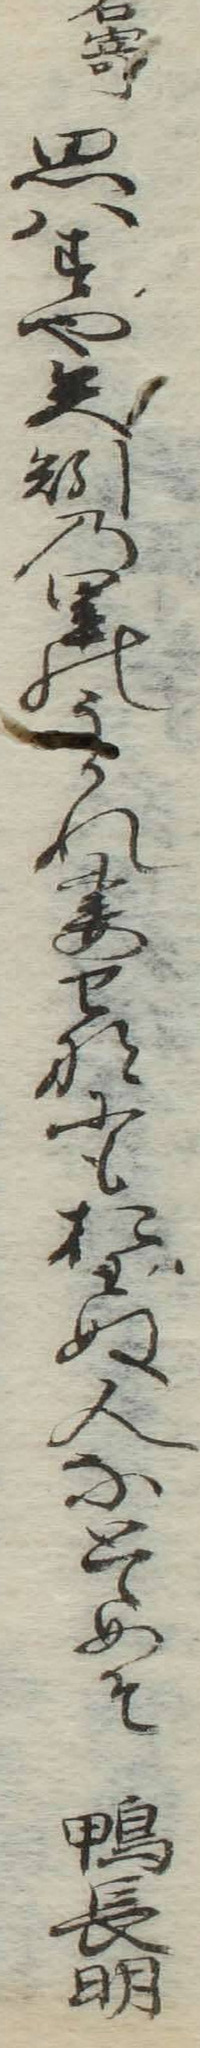名寄思はすや矢矧の里のうかれ妻せなにもおわぬ人なとゝめそ鴨長明
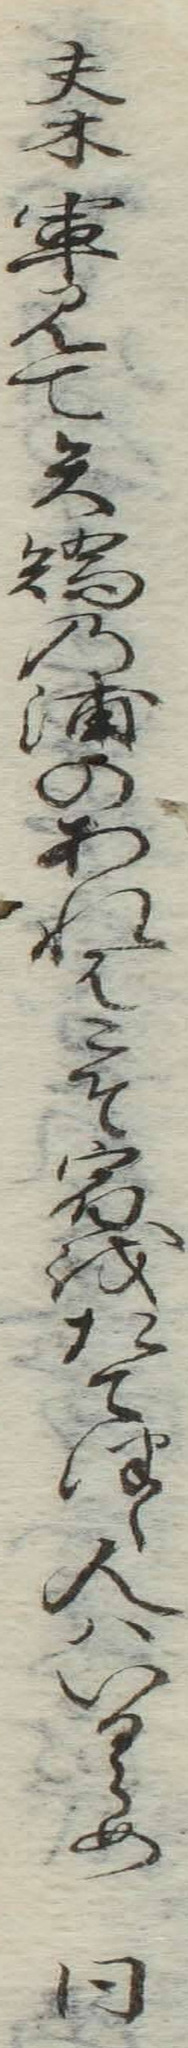夫木軍見て矢橋の浦のあれはこそ宿をたてつゝ人はいるらめ同
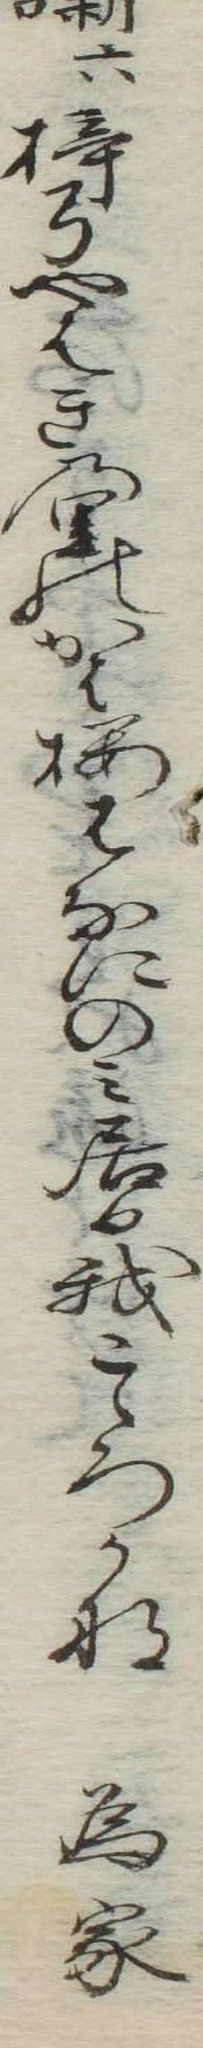新六帖梓弓やはきの里のかは桜はなにのみ居る我こゝろかな為家
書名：三河国二葉松
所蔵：国文学研究資料館
